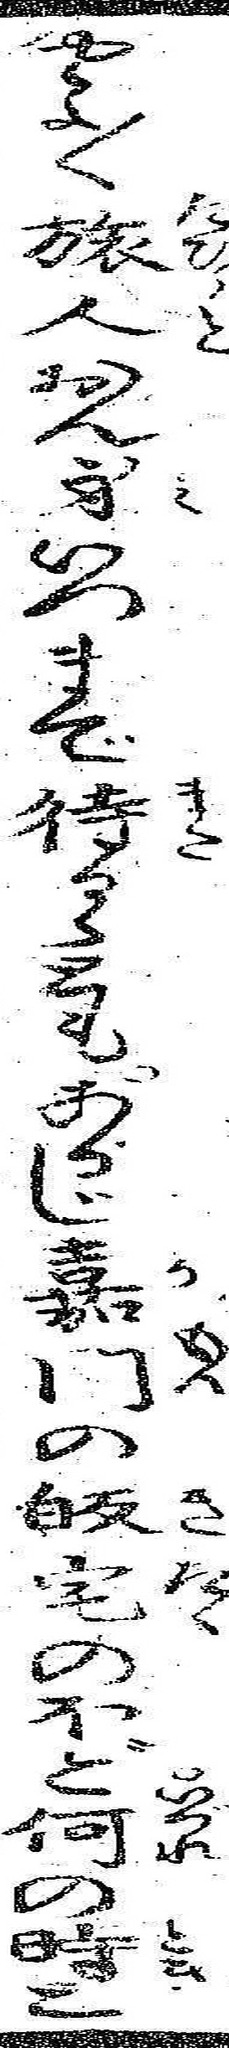やよ〳〵旅人おん身いつまで待るゝとも。あるじ嘉門の帰宅のほど。何の時と
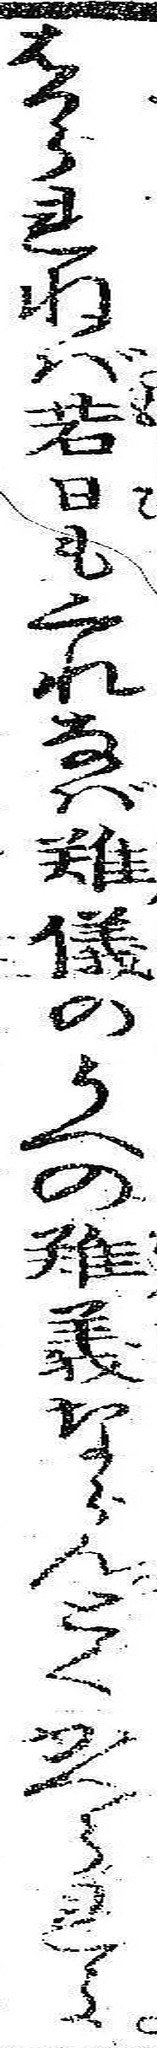はかられねば。若日もくれなば難儀のうへの難義ならん。とくかへられよ。
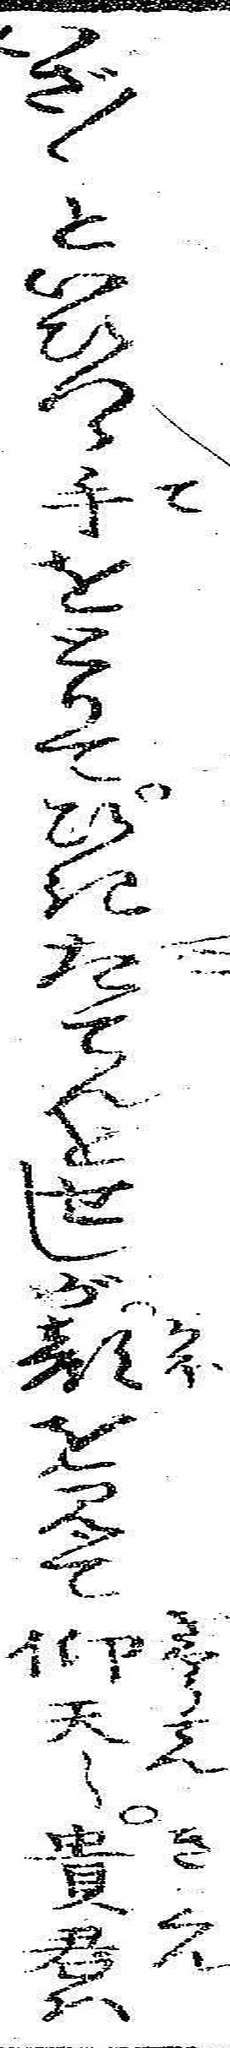いざ〳〵といひつゝ手をとりて。ひきたてんとせしが。顔を見て仰天し。貴君は
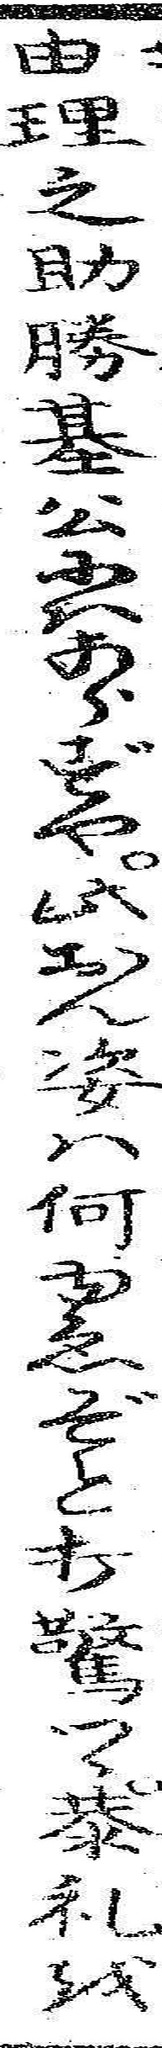由理之助勝基公にはあらずや。此おん姿は何ゆゑぞと打驚つゝ。恭礼を
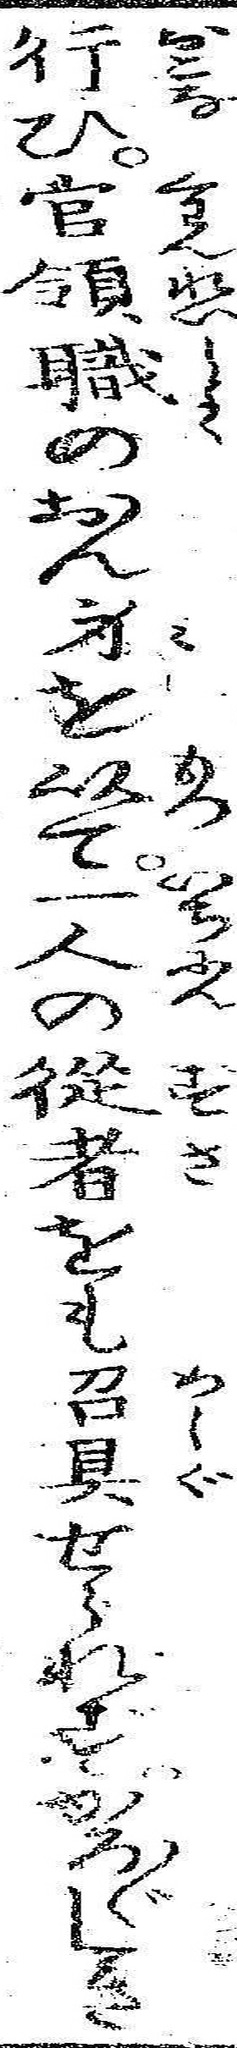行ひ。官領職のおん身を以て。一人の従者をも召具せられず。かろ〴〵しき
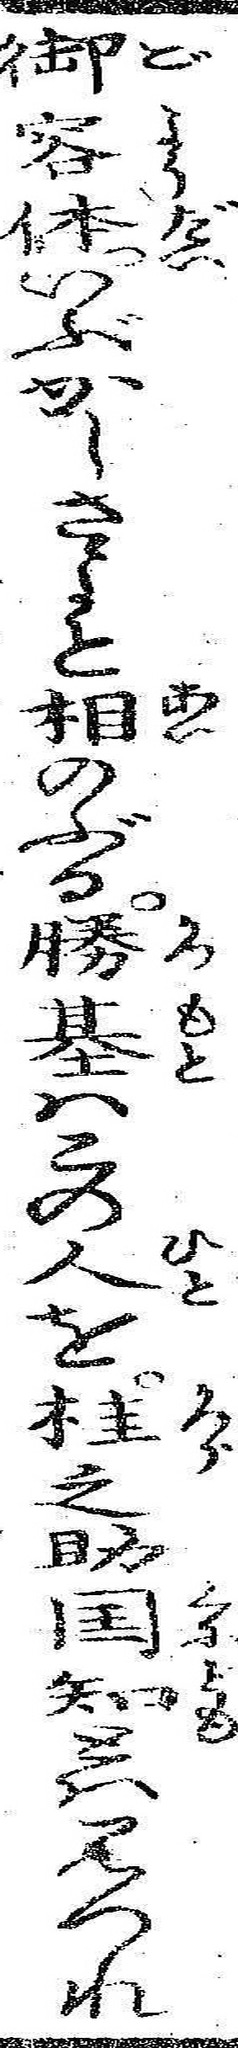御容体。いぶかしさよと相のぶる。勝基はこの人を。桂之助国知とは見つれ
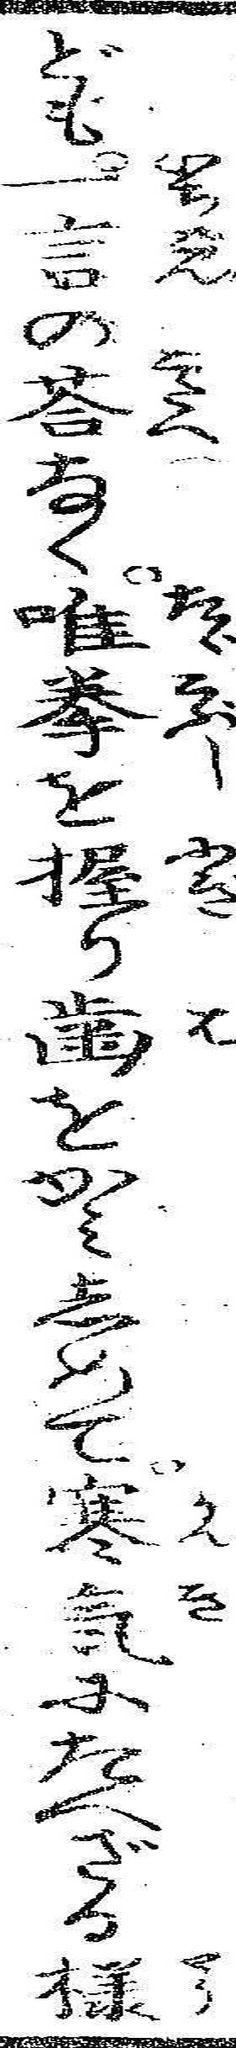ども。一言の荅なく。唯拳を握り歯をかみしめて。寒気にたへざる様
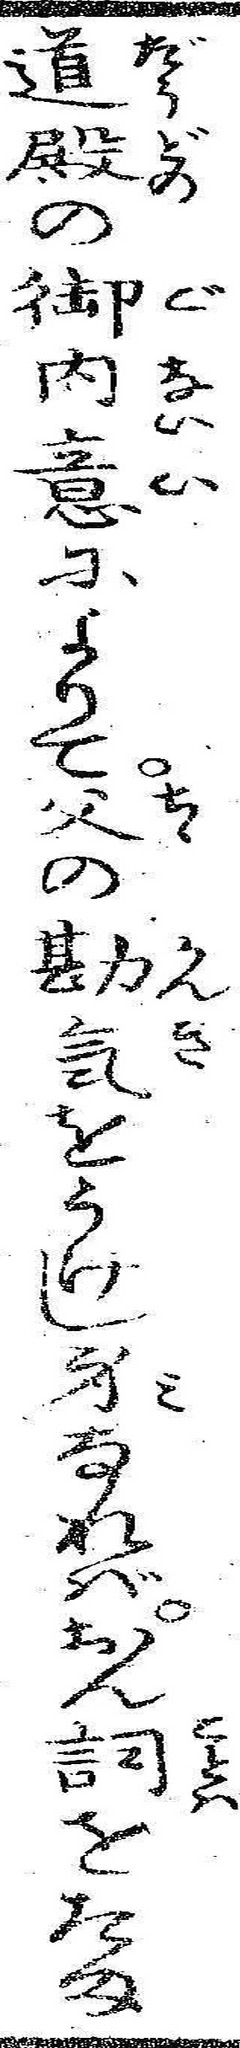道殿の御内意によりて。父の勘気をうけし身なれば。おん詞をたま
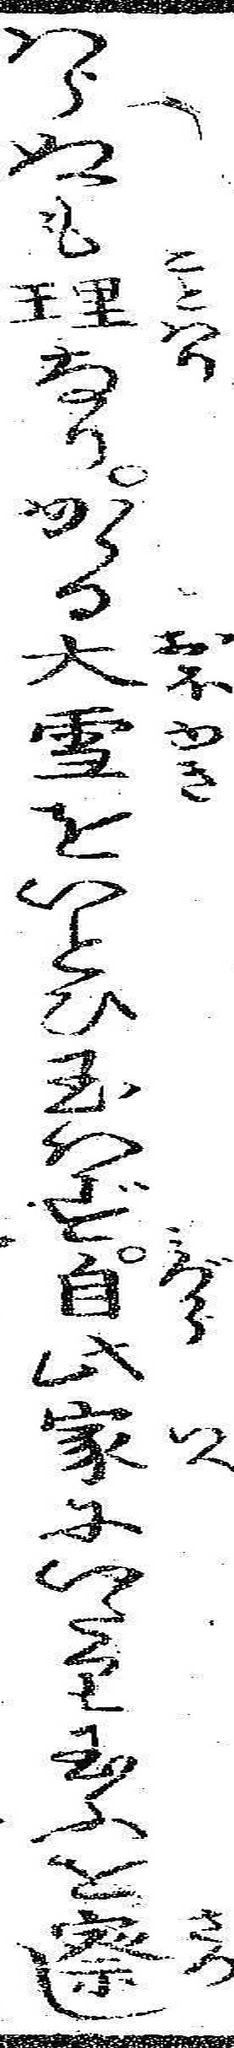はらぬも理なり。かゝる大雪をいとひ玉はず。自此家にいたり玉ふを察し
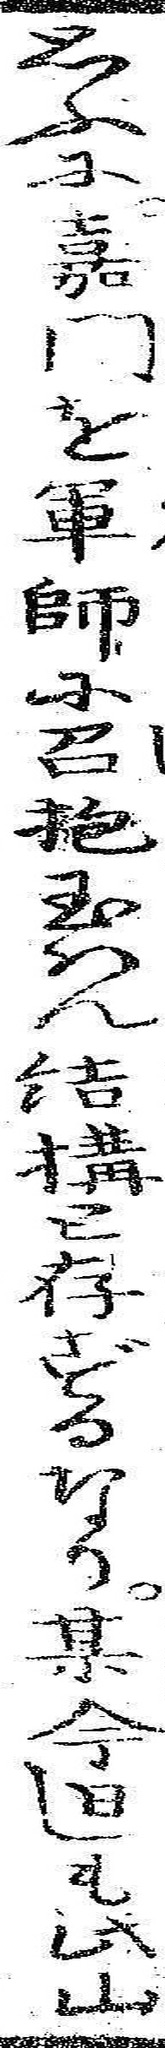思ふに。嘉門を軍師に召抱玉はん結構と存ずるなり。某今日しも此山
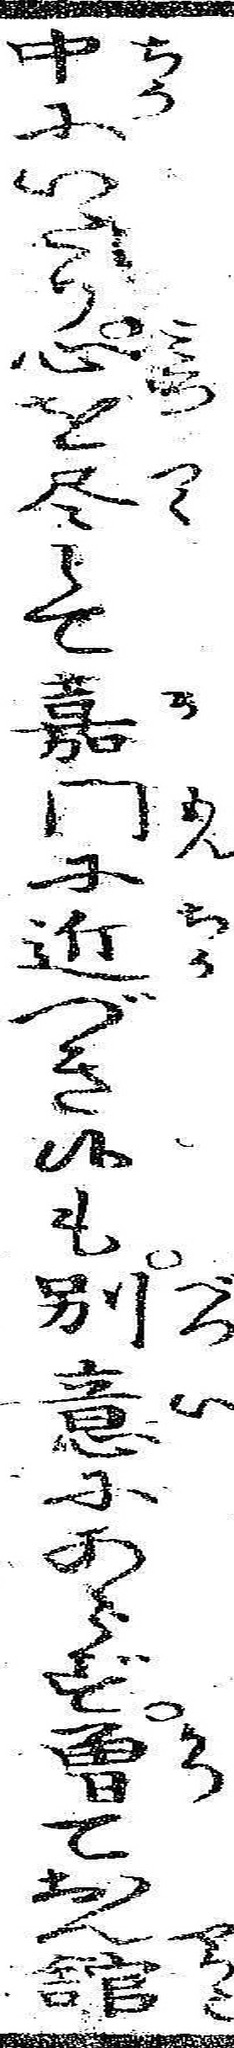中にいたり。心を尽して嘉門に近づき候も。別意にあらず。曽ておん館

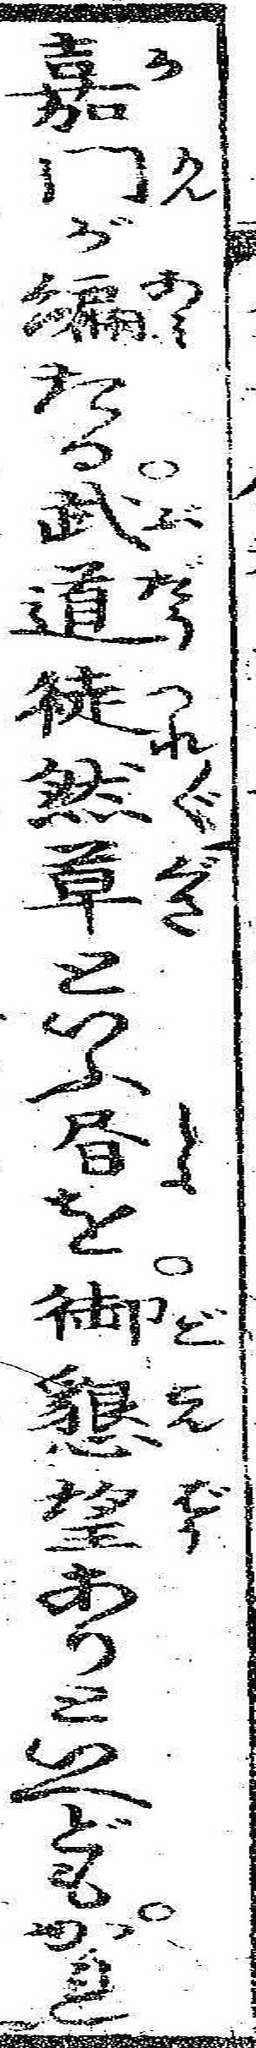嘉門が編たる。武道徒然草といふ書を。御懇望ありといへども。かれ
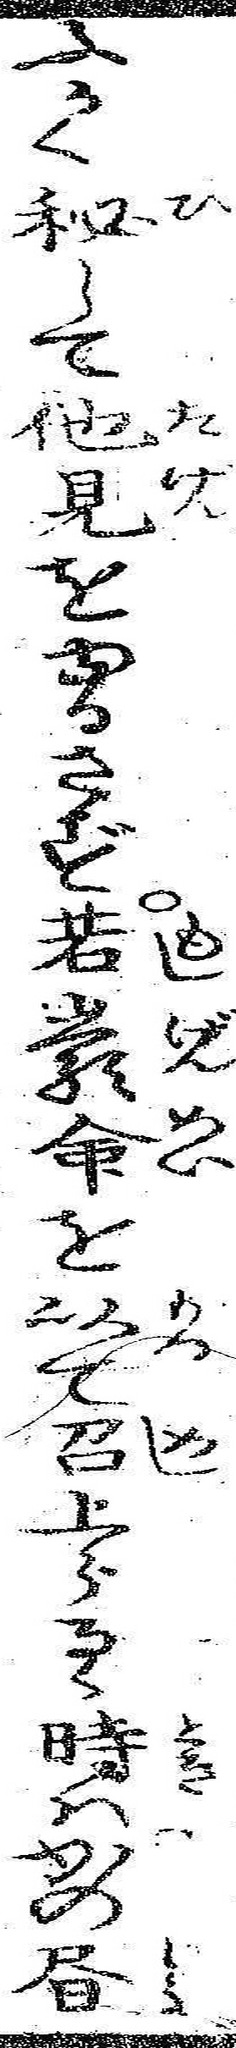ふかく秘して他見をゆるさず。若厳命を以て召上らるゝ時は。かの書
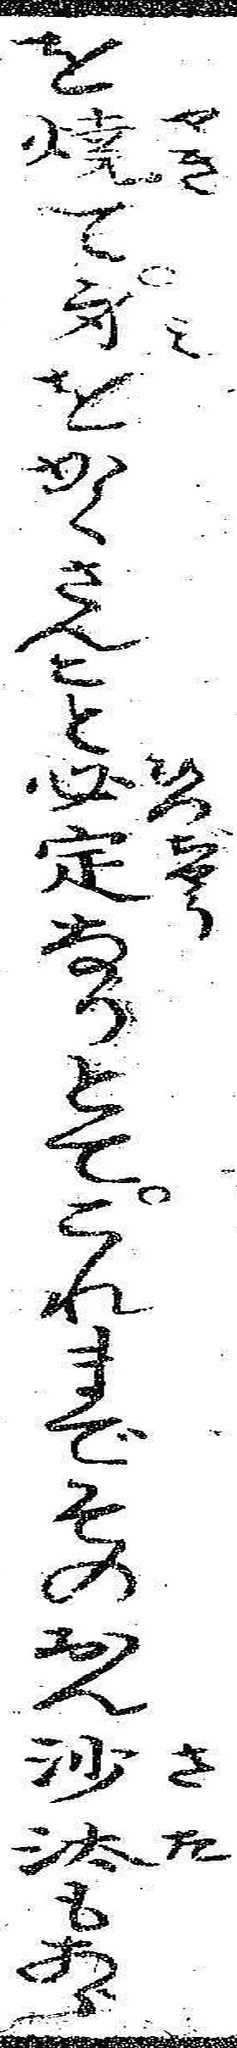を焼て。身をかくさんこと必定なりとて。これまでそのおん沙汰もあら
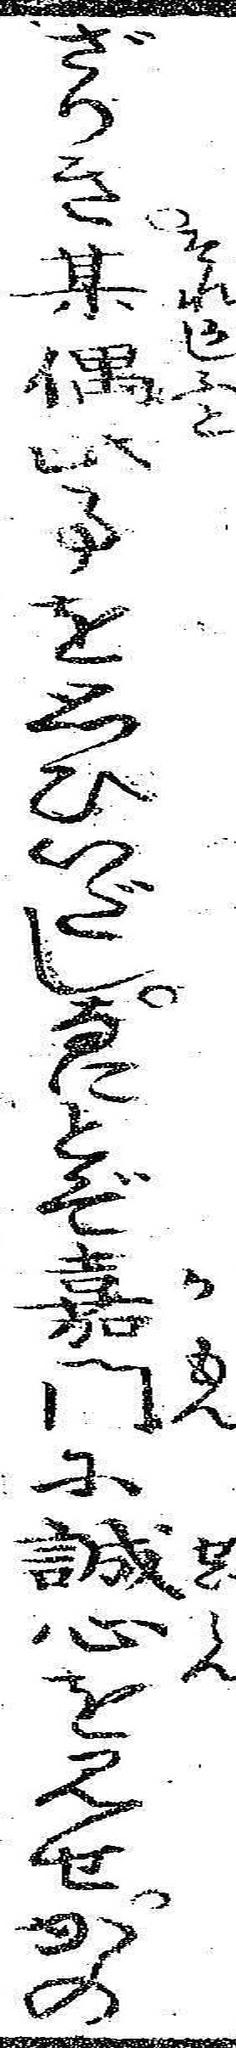ざりき。某偶此事を思ひいだし。なにとぞ嘉門に誠心を見せ。かの
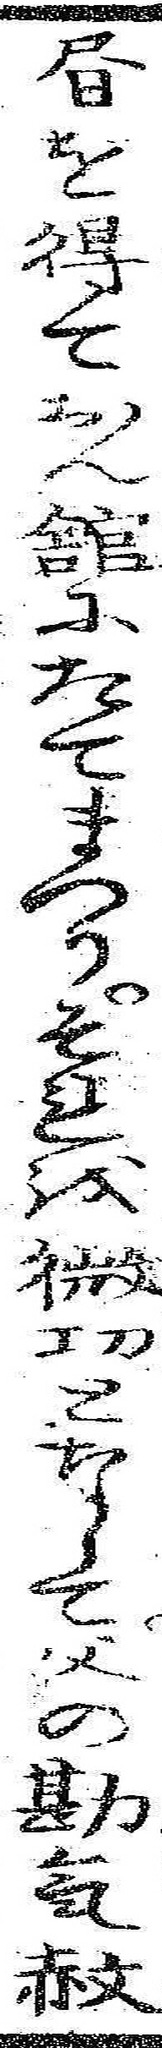書を得ておん館にたてまつり。それを微㓛となして。父の勘気赦
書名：昔話稲妻表紙
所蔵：国文学研究資料館
